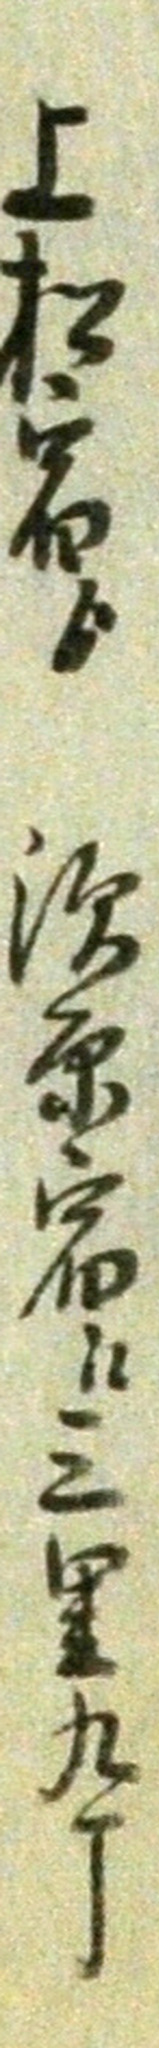上松宿ゟ須原宿江三里九丁
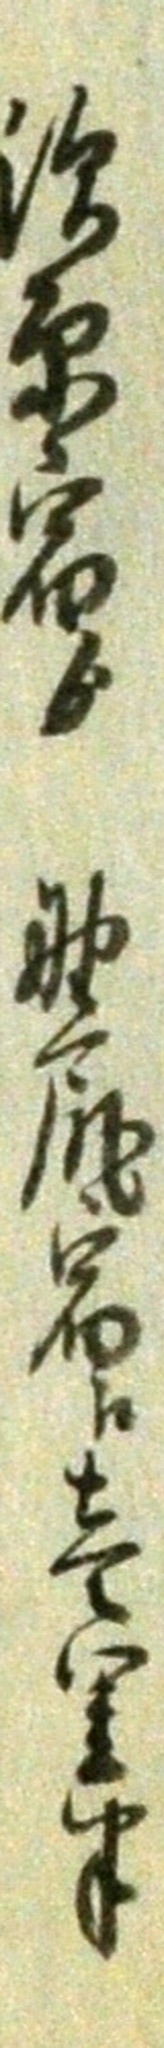須原宿ゟ野尻宿江壱里半
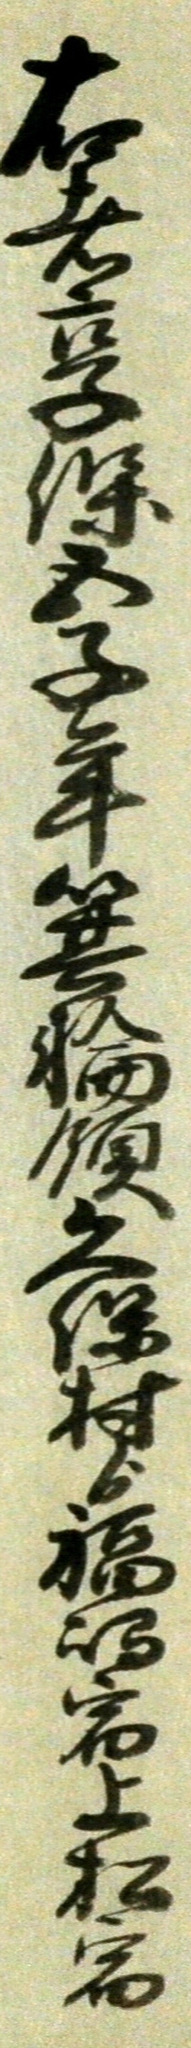右者享保五子年箕輪領久保村ゟ福嶋宿上松宿
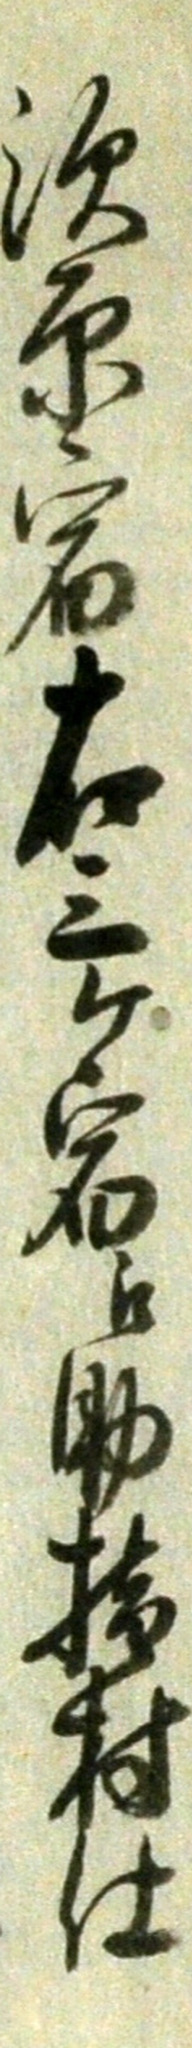須原宿右三ヶ宿江助指村仕
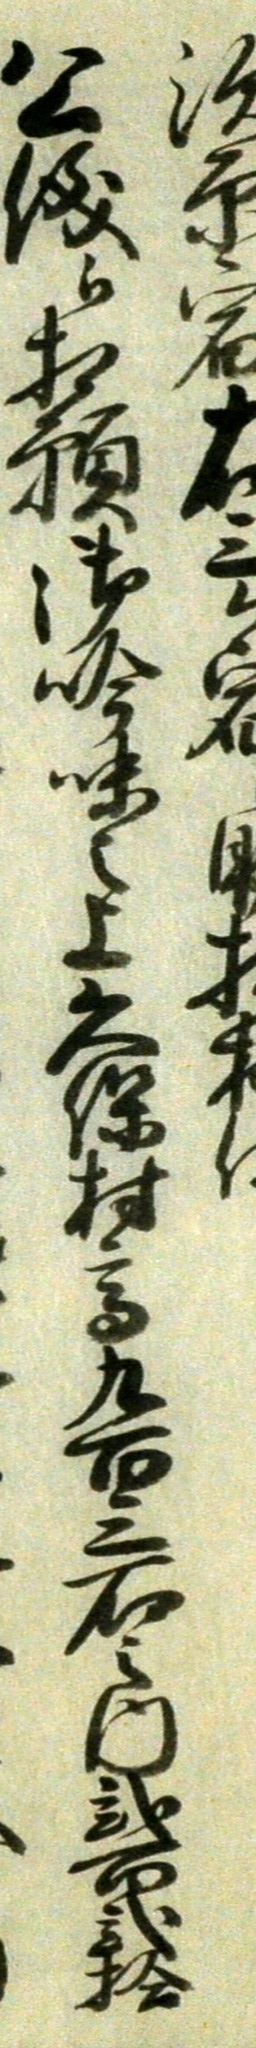公儀江相願御吟味之上久保村高九百三石之内弐百弐拾
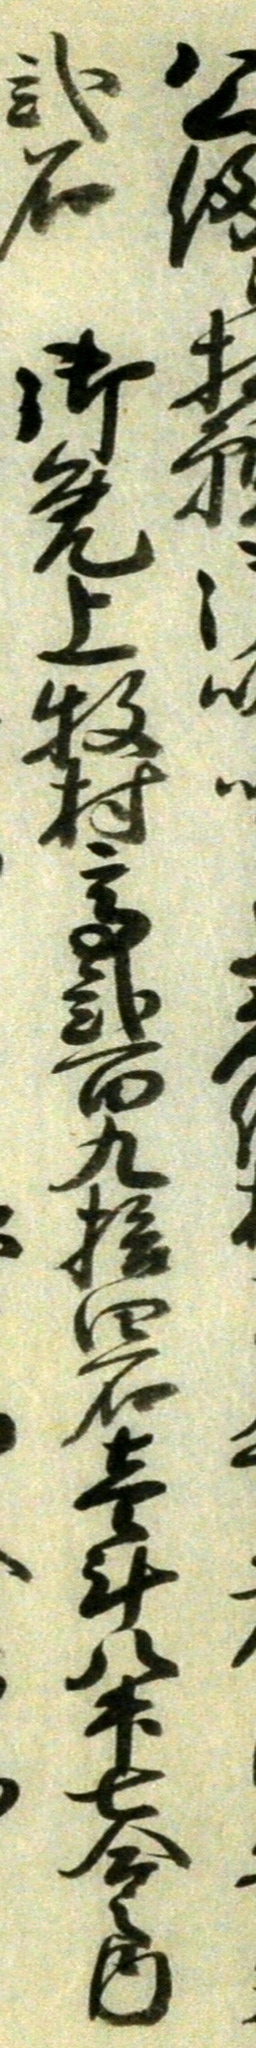弐石御免上牧村高弐百九拾四石壱斗八升七合之内
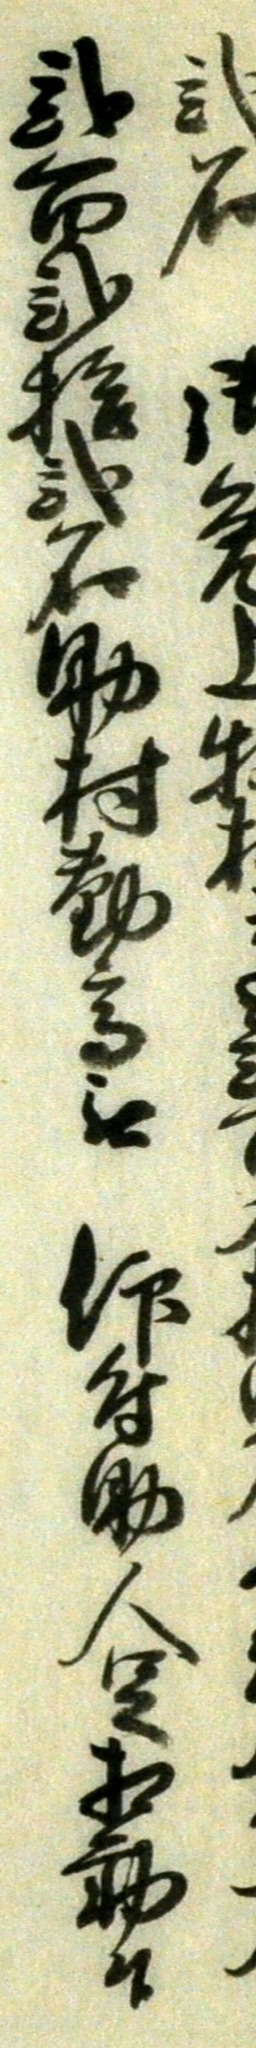弐百弐拾弐石助村勤高被仰付助人足相勤候
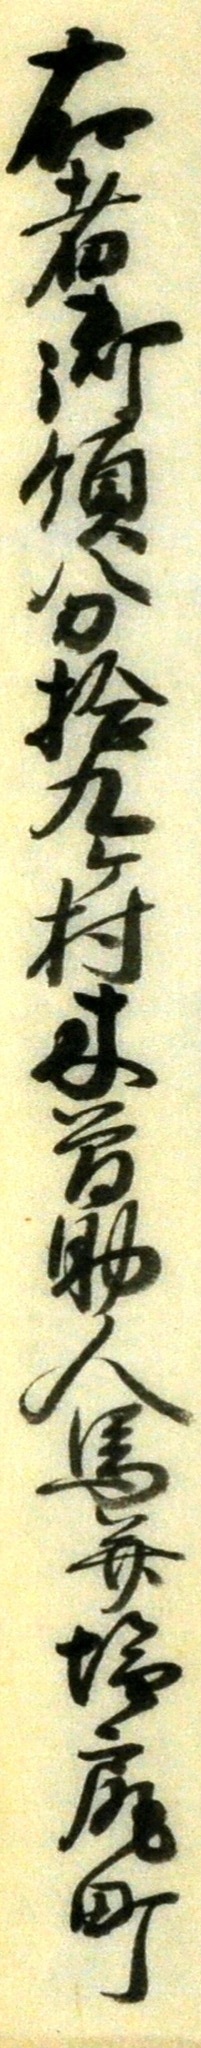右者御領分拾九ヶ村木曽助人馬并塩尻町
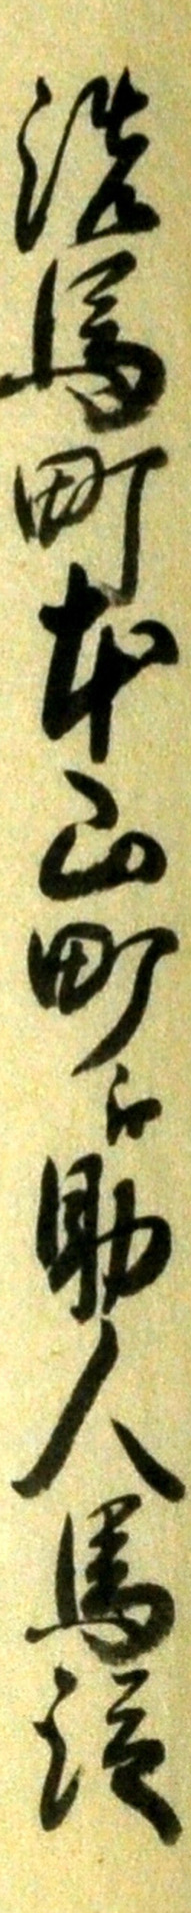洗馬町本山町江助人馬従
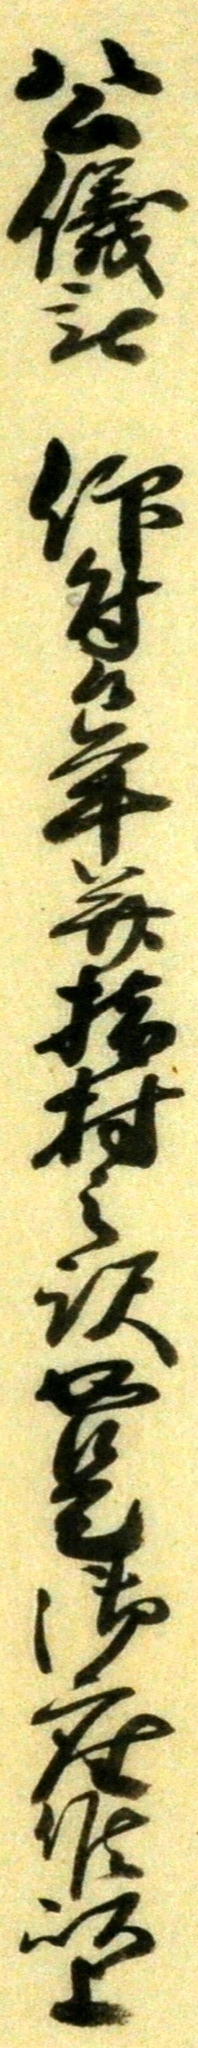公儀被仰付候年并指村之訳如是御座候以上
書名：御領分拾九箇村木曽助并塩尻町・洗馬町・本山町へ人馬勤覚帳
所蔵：伊那市立高遠町図書館・合同会社AMANE
